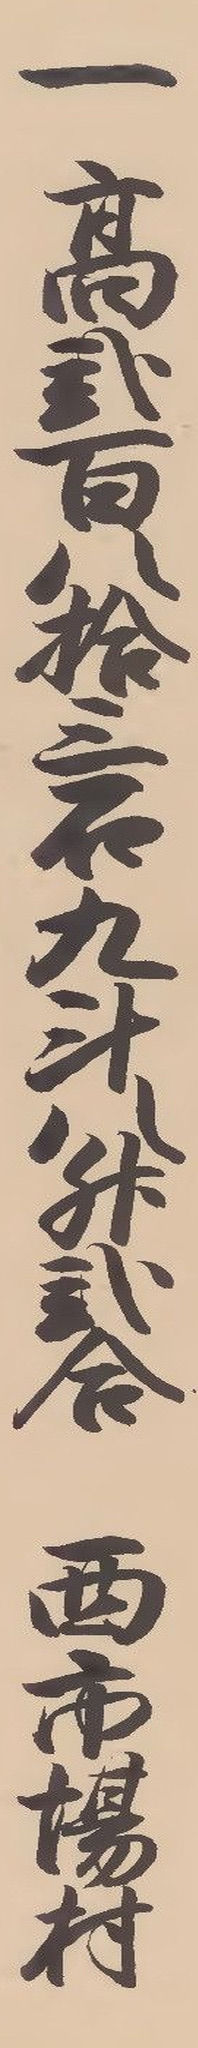一高弐百八拾三石九斗八升弐合西市場村
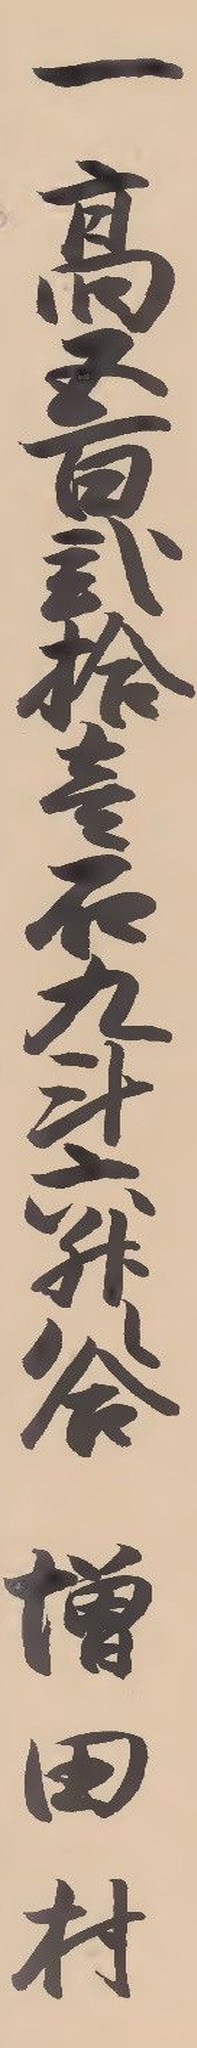一高五百弐拾壱石九斗六升八合増田村
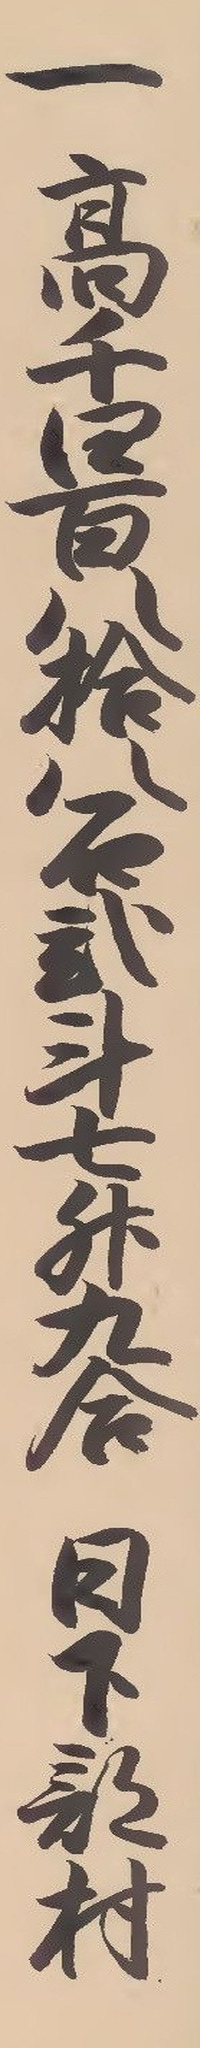一高千四百八拾八石弐斗七升九合日下部村
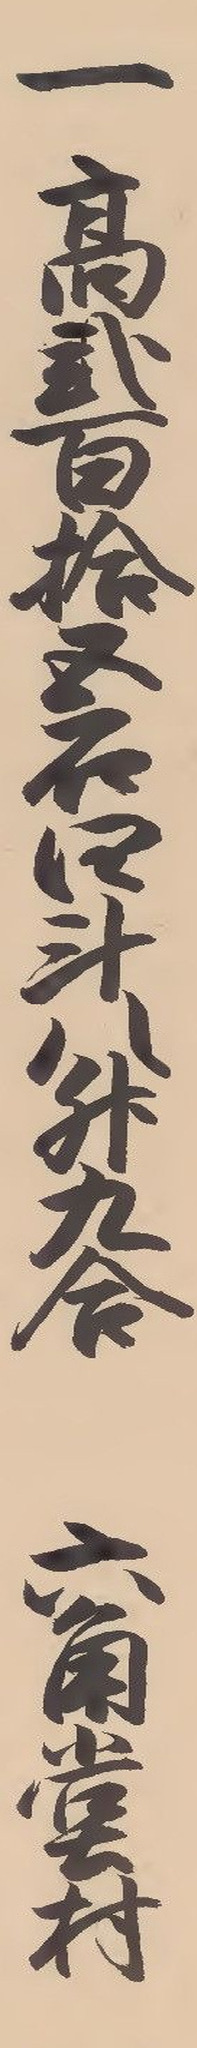一高弐百拾五石四斗八升九合六角堂村
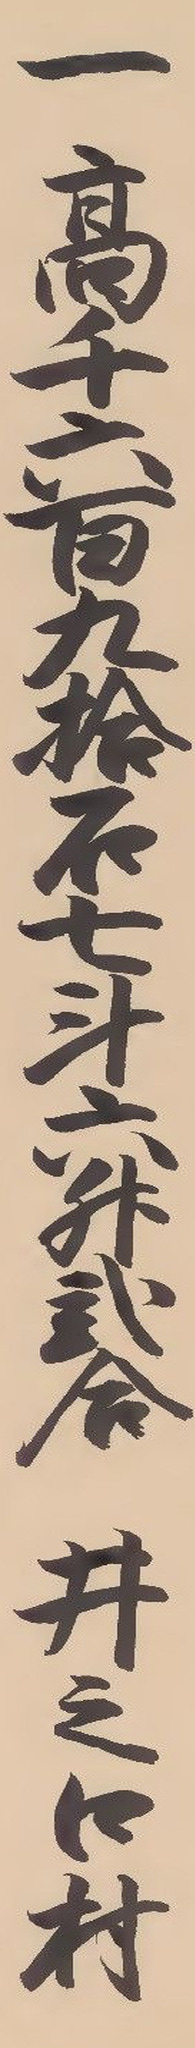一高千六百九拾石七斗六升弐合井之口村
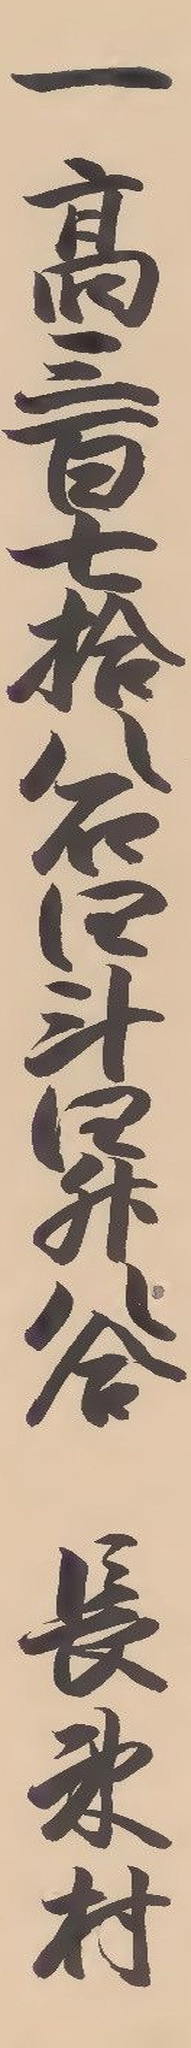一高三百七拾八石四斗四升八合長束村

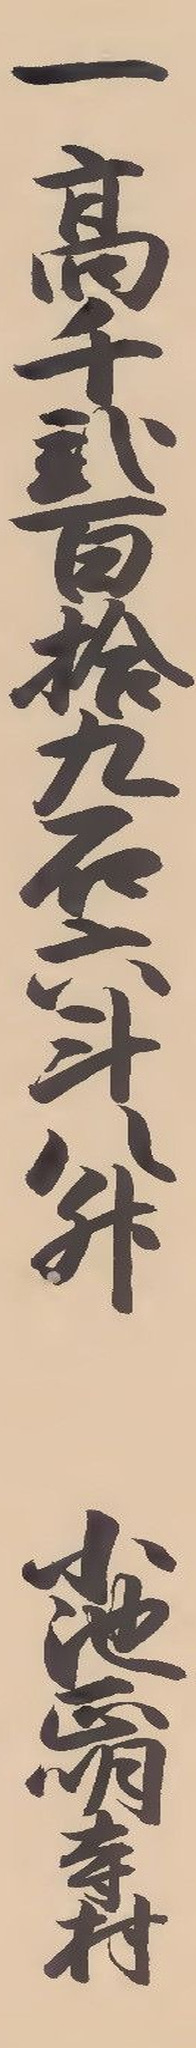一高千弐百拾九石六斗八升小池正明寺村
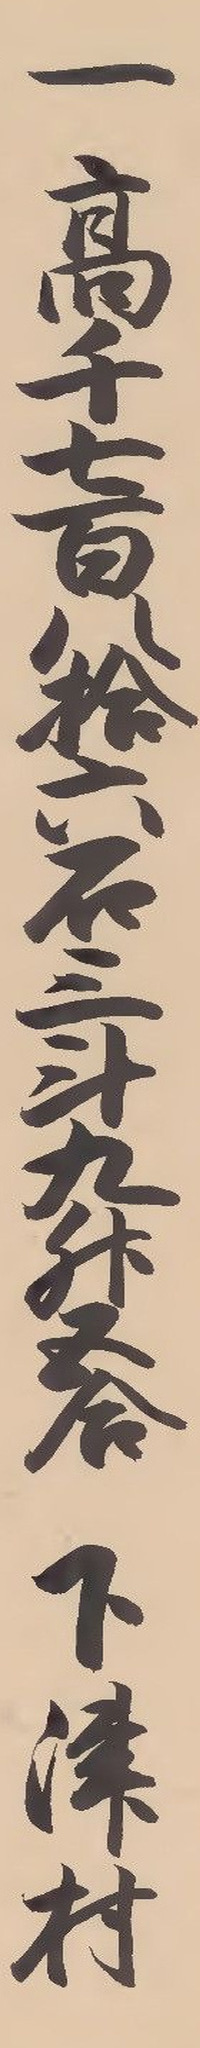一高千七百八拾六石三斗九升五合下津村
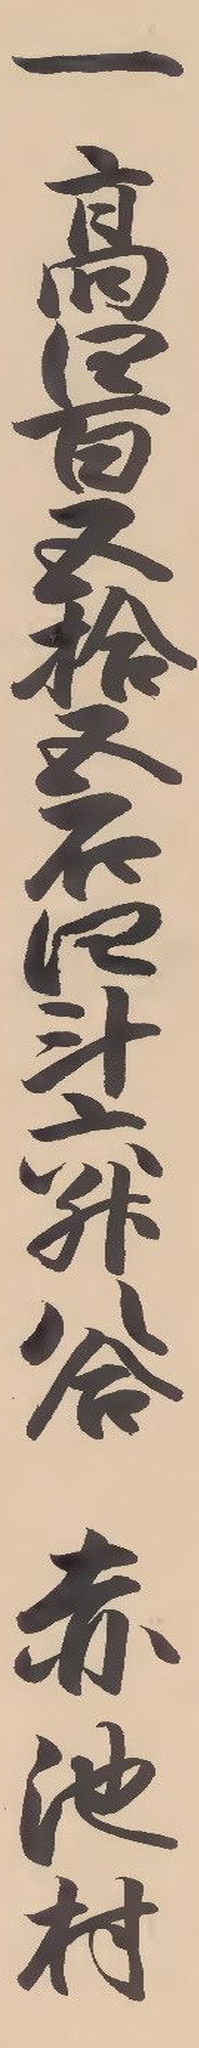一高四百五拾五石四斗六升八合赤池村
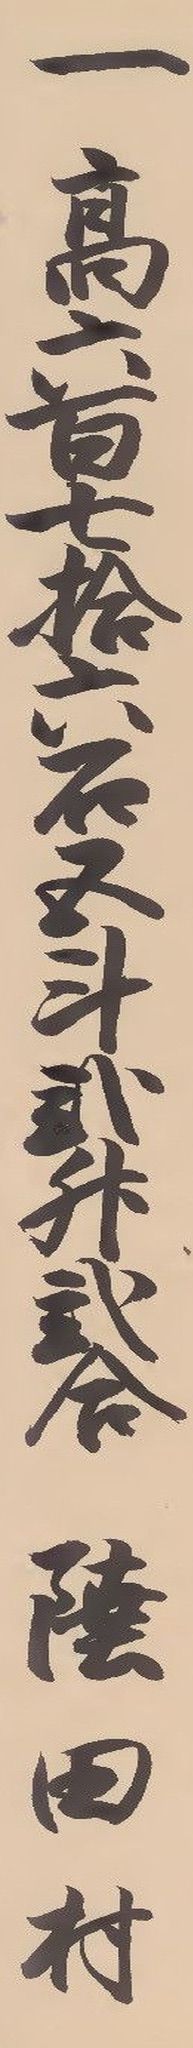一高六百七拾六石五斗弐升弐合陸田村
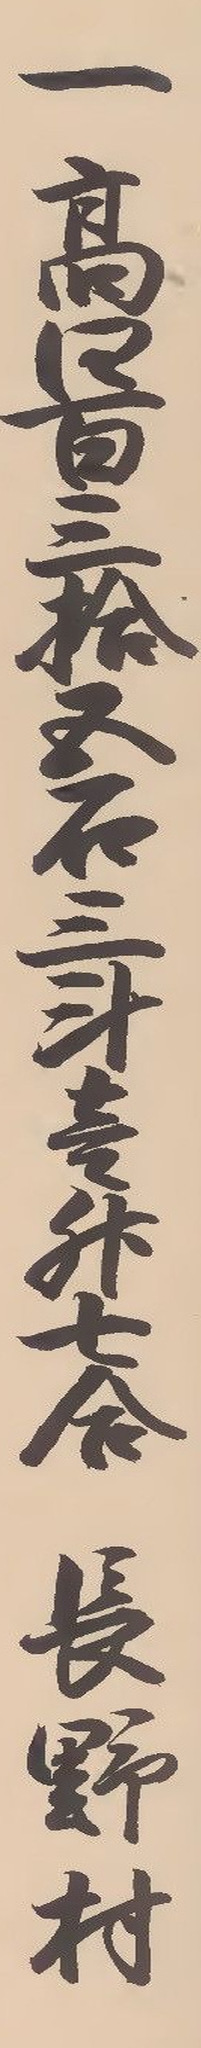一高四百三拾五石三斗壱升七合長野村
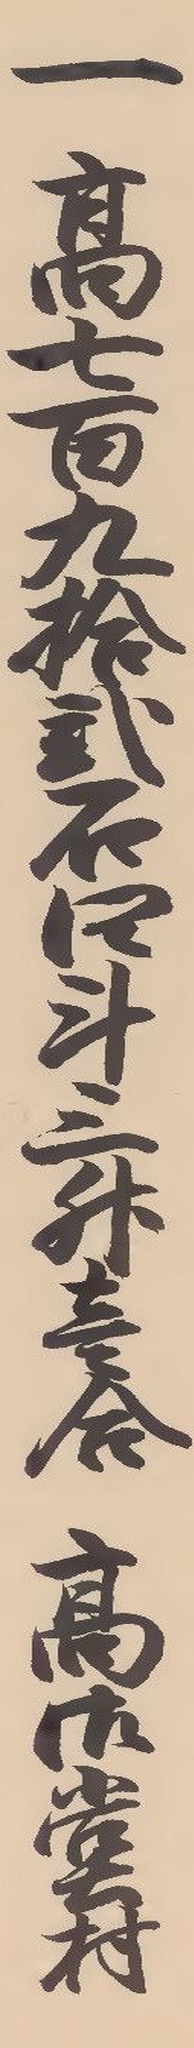一高七百九拾弐石四斗三升壱合高御堂村
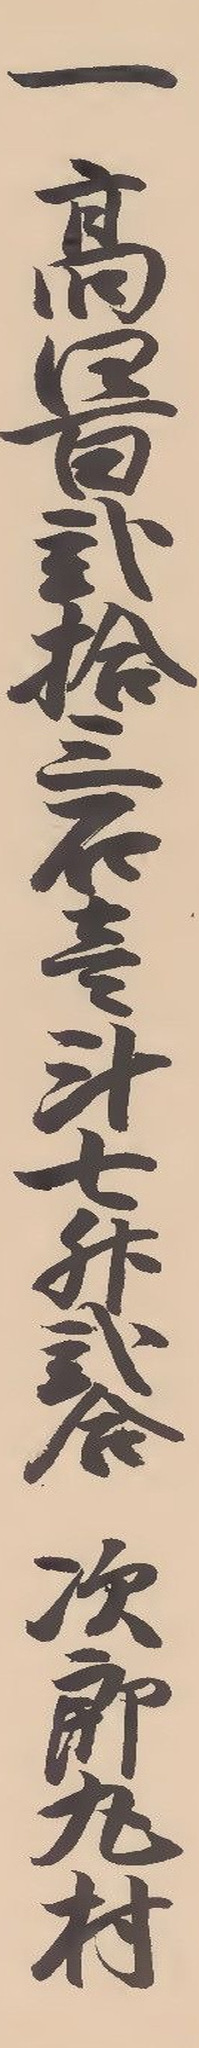一高四百弐拾三石壱斗七升弐合次郎丸村
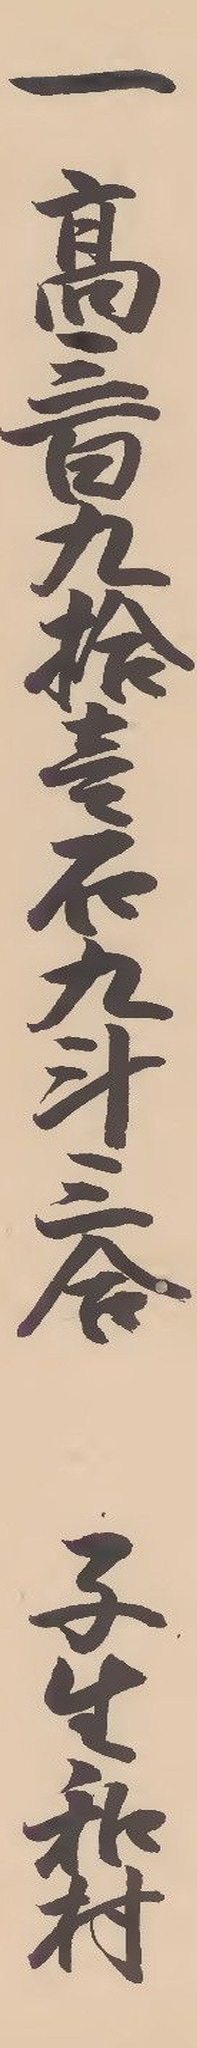一高三百九拾壱石九斗三合子生和村

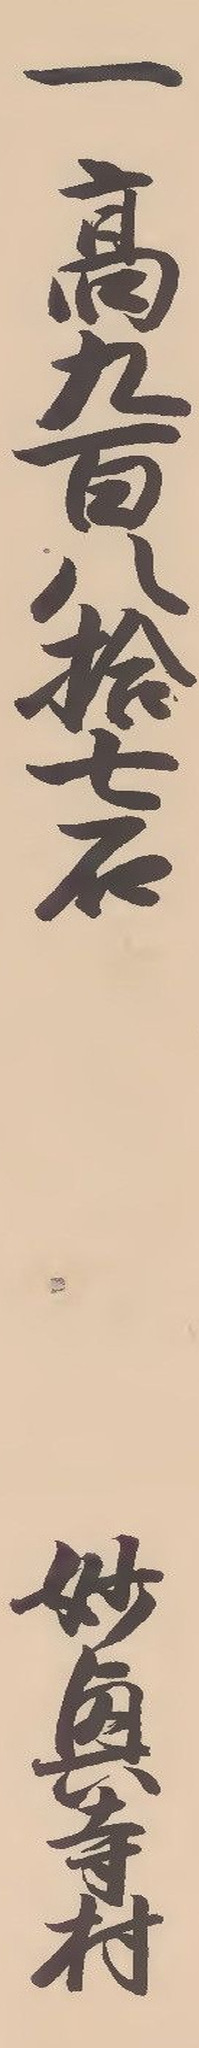一高九百八拾七石妙興寺村
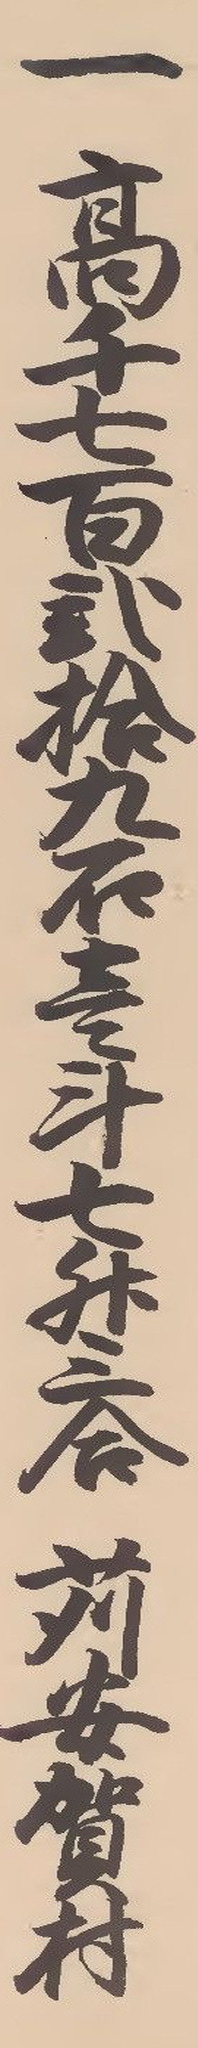一高千七百弐拾九石壱斗七升三合苅安賀村
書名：尾張国郷帳
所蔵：国立公文書館 National Archives of Japan
